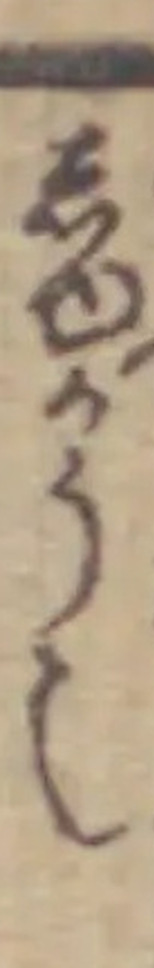しゆかう也
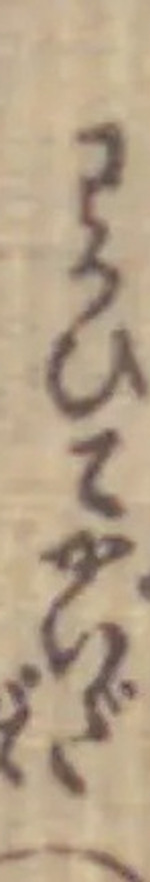わかひてやいだぞ
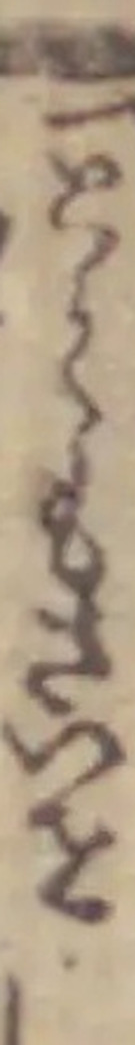〽とてもさいを
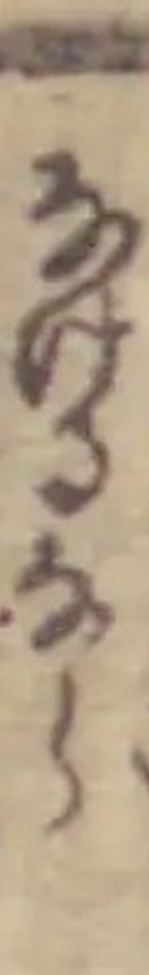なけるなら
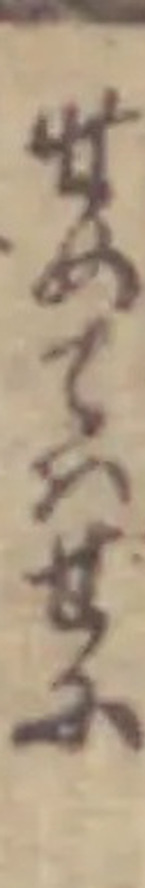せめてはぜに
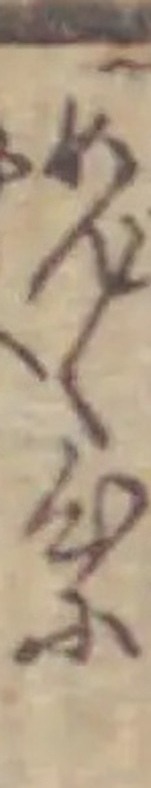めん〳〵心に
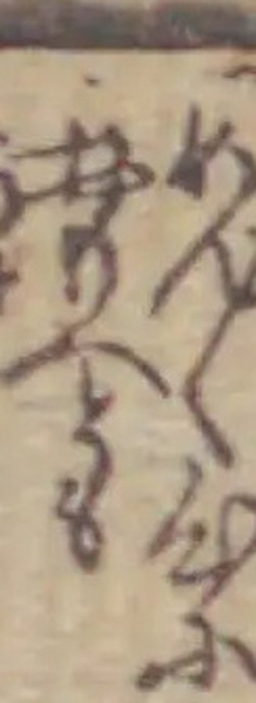おもへとも

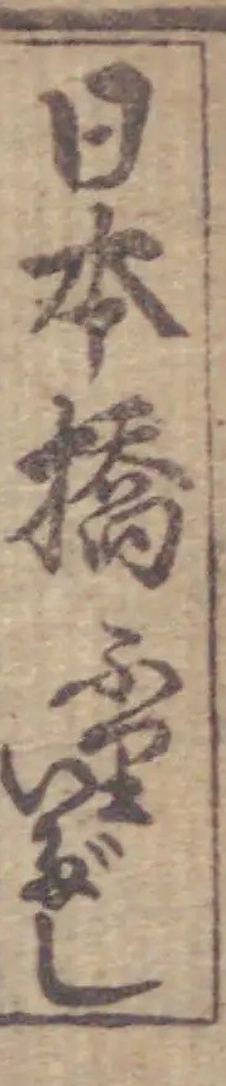日本橋ふりいだし
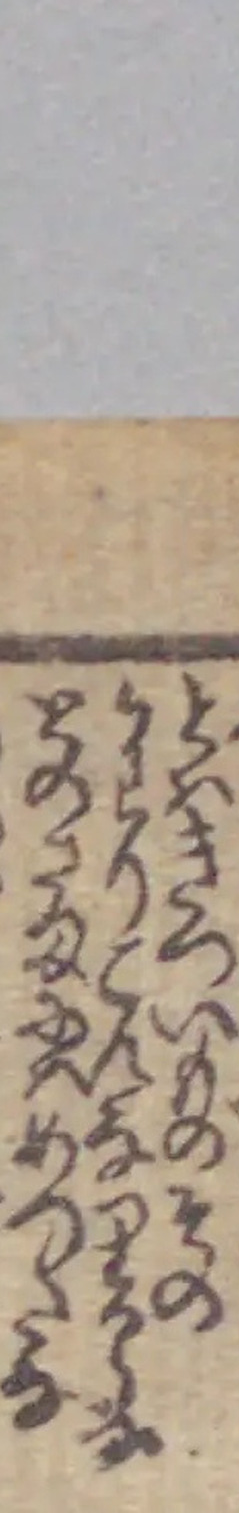とのさまにはめつたな
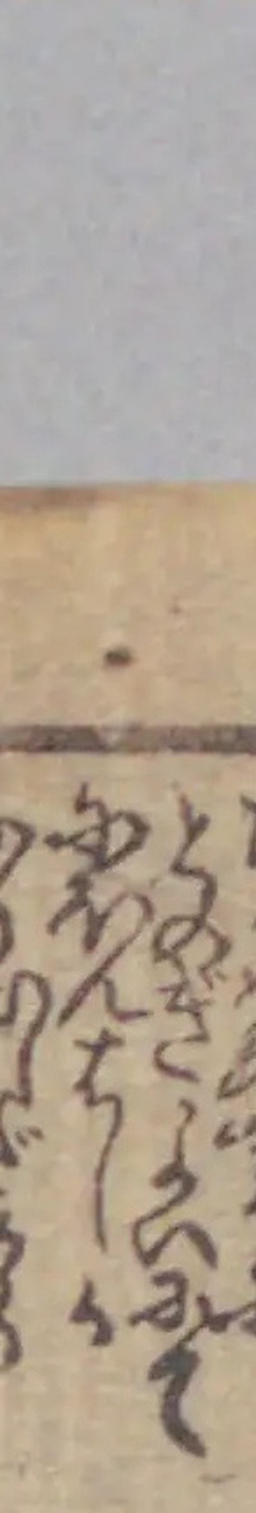にほんはしか
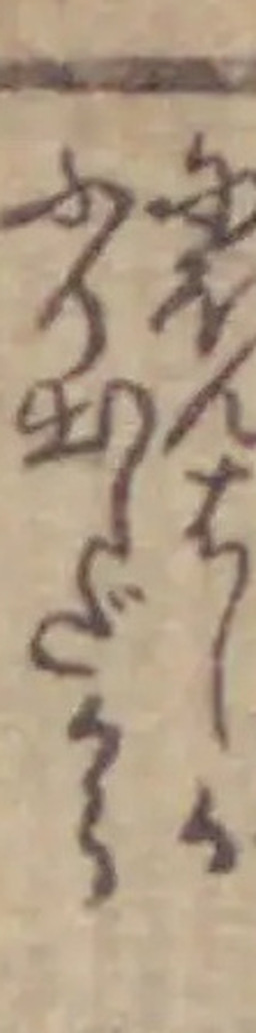ふり出しだから
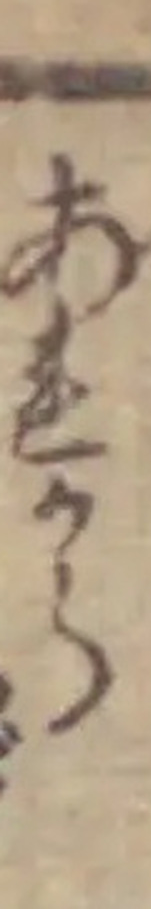あれから
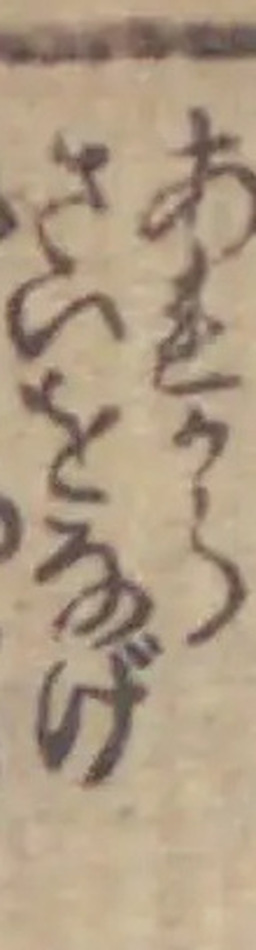さいをなげ
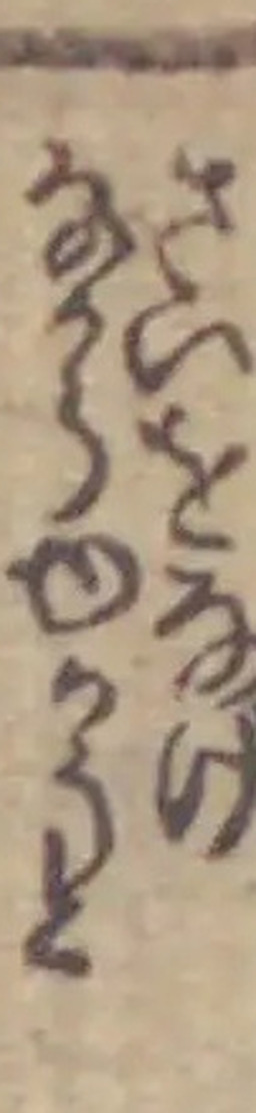なからゆかうと
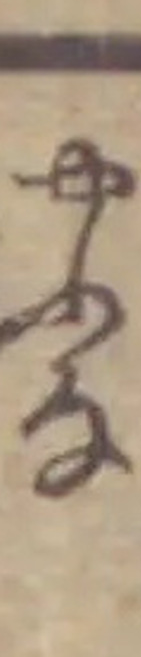やふな
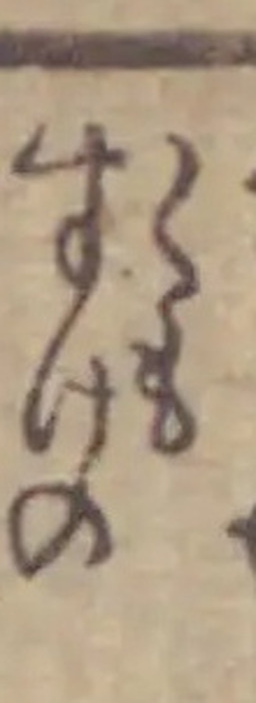すけの
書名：道笑双六
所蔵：国立国会図書館 National Diet Library, JAPAN
